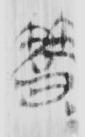{竹亯}
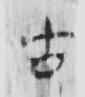古
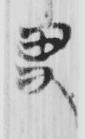卑
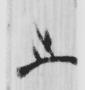之
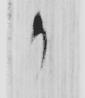人
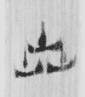芔
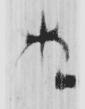木
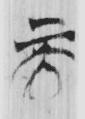而
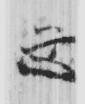正
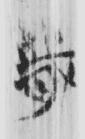歲
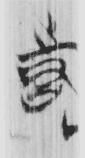𠱾
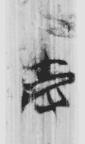皮
